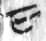日
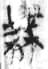無
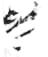爲
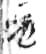而
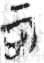可
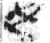女（如）
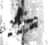㠯（以）
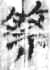祭
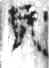祀
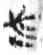必
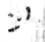又（有）
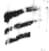三
